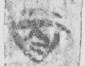百
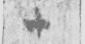十
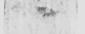一
